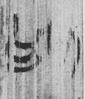爲
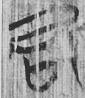君
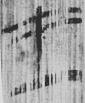王
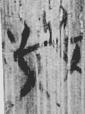戔
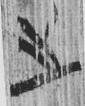之
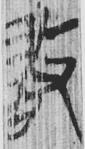敢
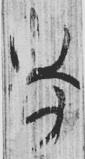告
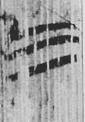於
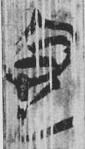見〈視〉
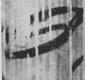日
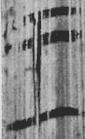王
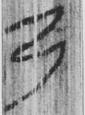乃
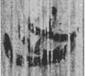出
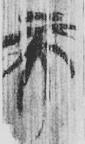而
